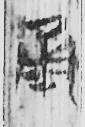甬
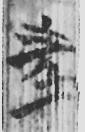{屮王}
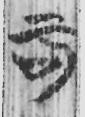可
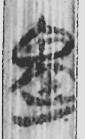畏
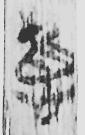惪
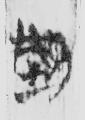型
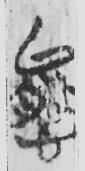態
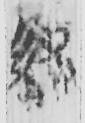絉
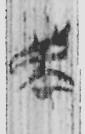民
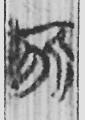所
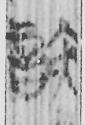訞
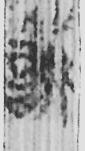{言比}（僻）
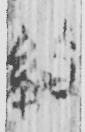約
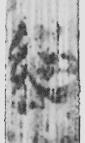結
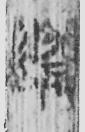{糸興}
